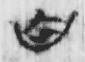自
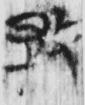○（屬）
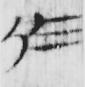於
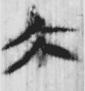大
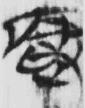○（厩）
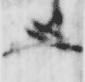之
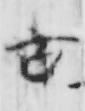古（故）
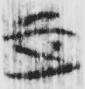正
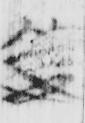義
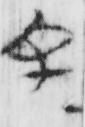牢
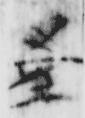往
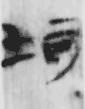坷
